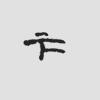下
